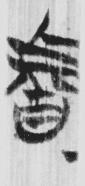者
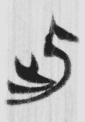此
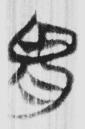胃
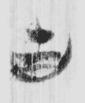由
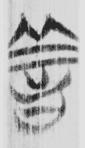善
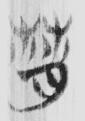{𣏟月}
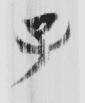子
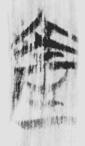產
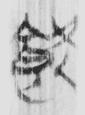既
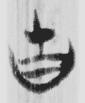由
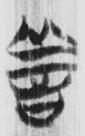善
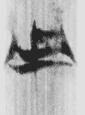用
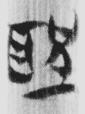聖
